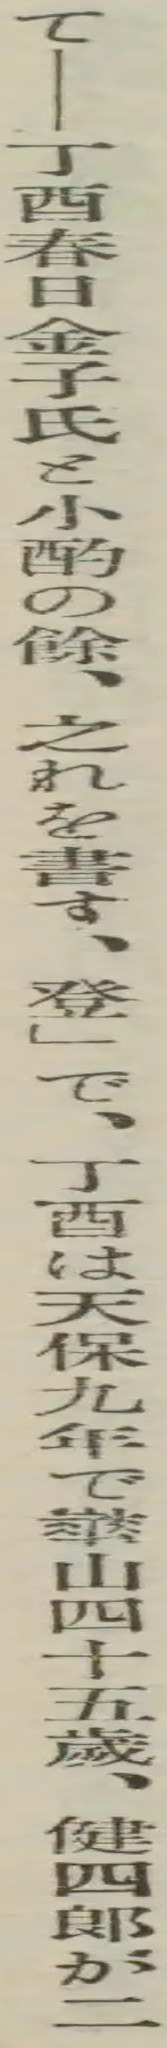て――丁酉春日金子氏と小酌の余、之れを書す、登」で、丁酉は天保九年で蕐山四十五歳、健四郎が二
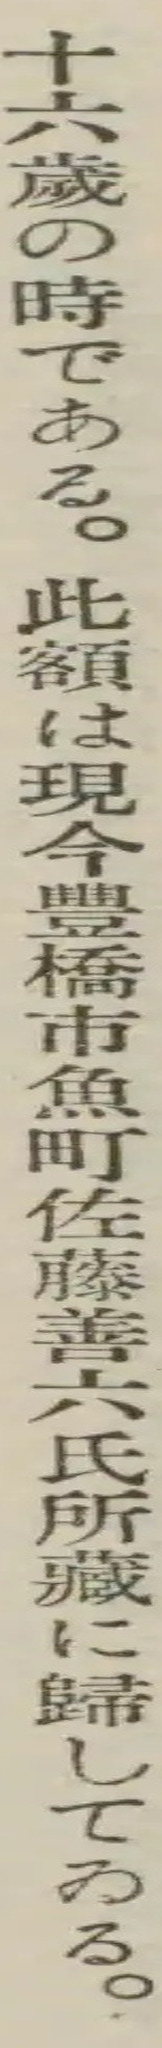十六歳の時である。此額は現今豊橋市魚町佐藤善六氏所蔵に帰してゐる。
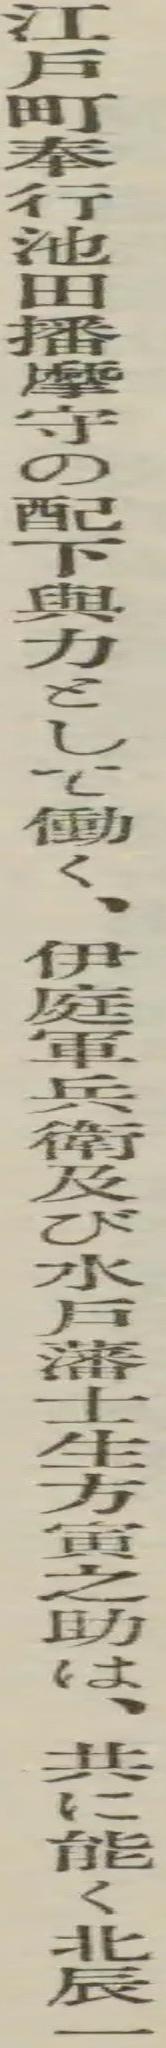江戸町奉行池田播磨守の配下与力として働く、伊庭軍兵衛及び水戸藩士生方虎之助は、共に能く北辰一
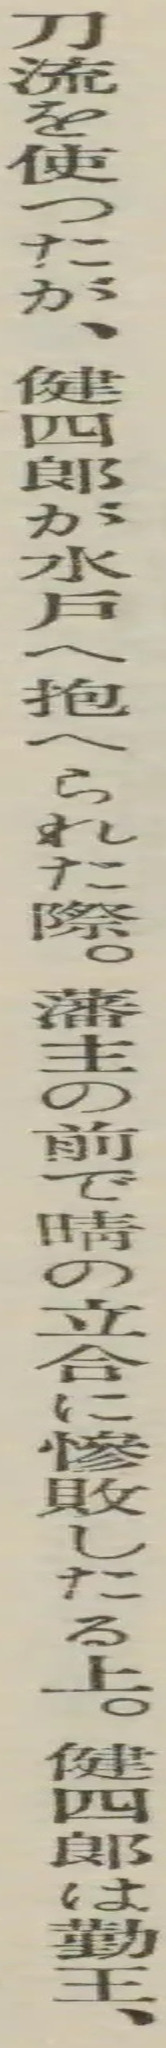刀流を使つたが、健四郎が水戸へ抱へられた際。藩主の前で晴の立合に惨敗したる上。健四郎は勤王、
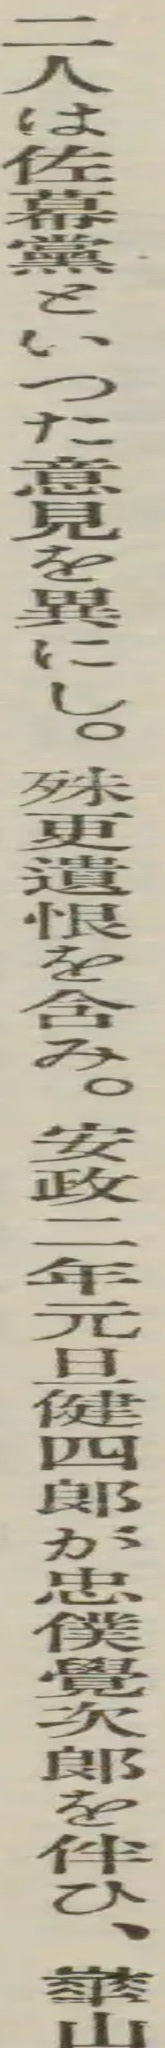二人は佐幕党といつた意見を異にし。殊更遺恨を含み。安政二年元旦健四郎が忠僕覺次郎を伴ひ、蕐山
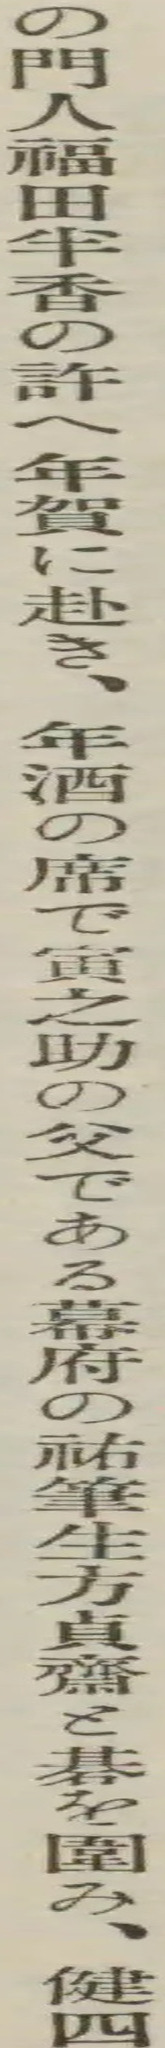の門人福田半香の許へ年賀に赴き、年酒の席で虎之助の父である幕府の祐筆生方貞齋と碁を囲み、健四
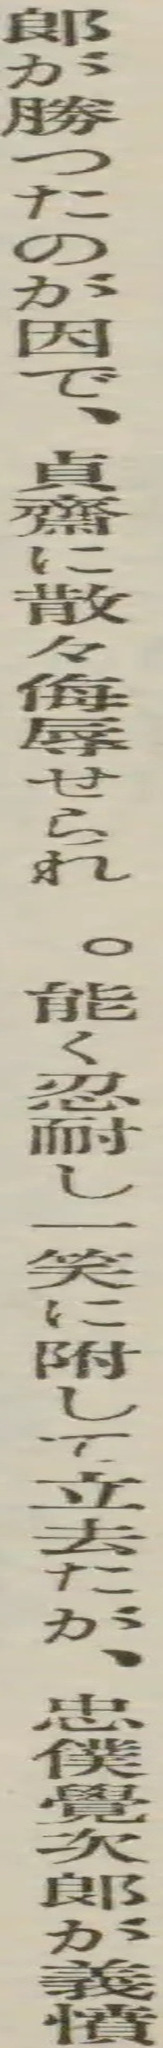郎が勝つたのが因で、貞齋に散々侮辱せられ。能く忍耐し一笑に附して立去たが、忠僕覺次郎が義憤
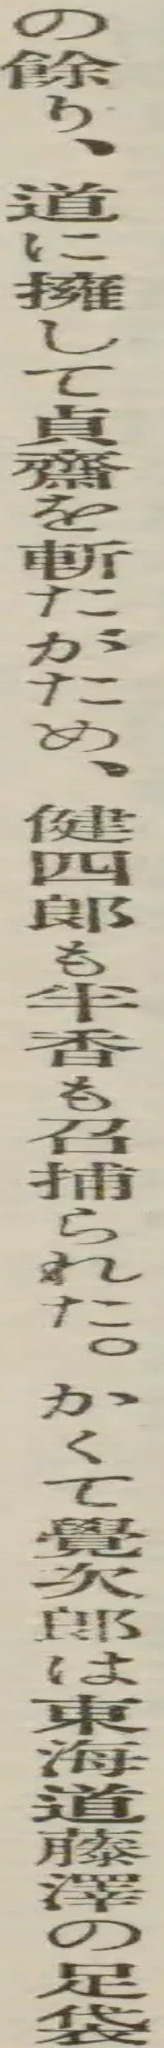の余り、道に擁して貞齋を斬たがため、健四郎も半香も召捕られた。かくて覺次郎は東海道藤沢の足袋
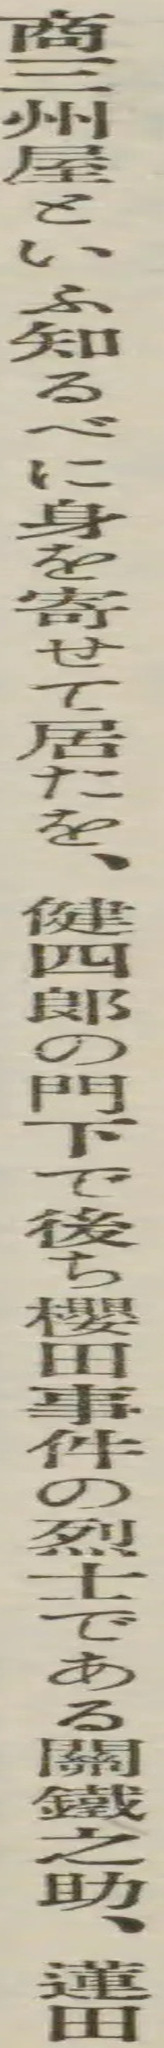商三州屋といふ知るべに身を寄せて居たを、健四郎の門下で後ち桜田事件の烈士である關鐵之助、蓮田
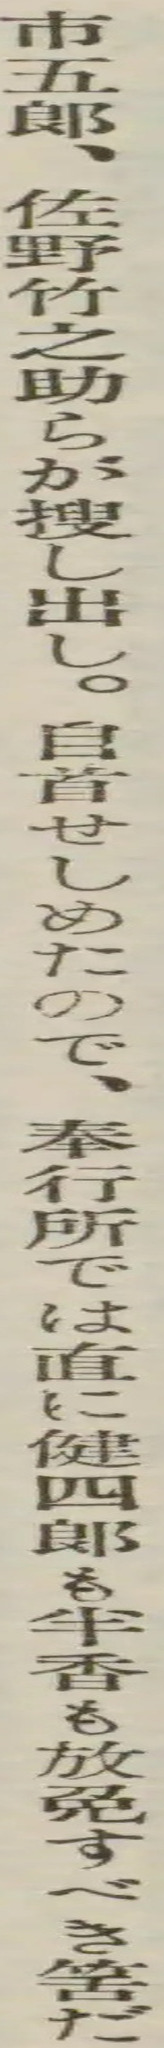市五郎、佐野竹之助らが捜し出し。自首せしめたので、奉行所では直に健四郎も半香も放免すべき筈だ
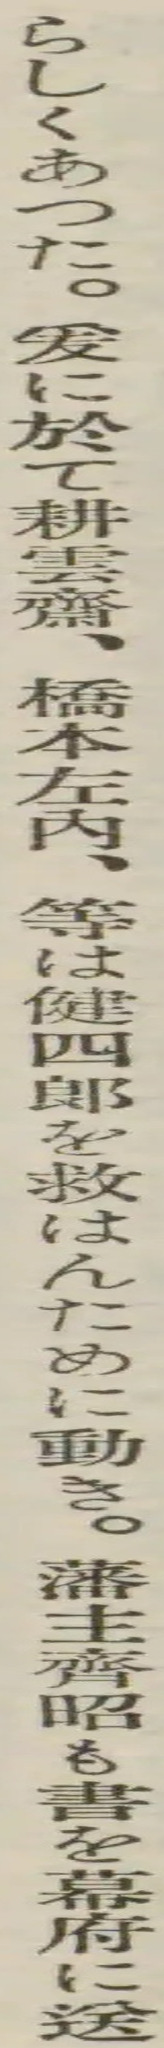らしくあつた。爰に於て耕雲齋、橋本左内、等は健四郎を救はんために動き。藩主齊昭も書を幕府に送
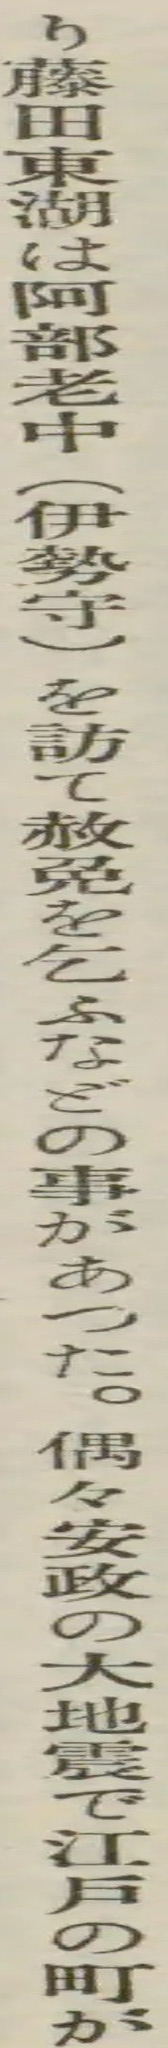り藤田東湖は阿部老中(伊勢守)を訪て赦免を乞ふなどの事があつた。偶々安政の大地震で江戸の町が
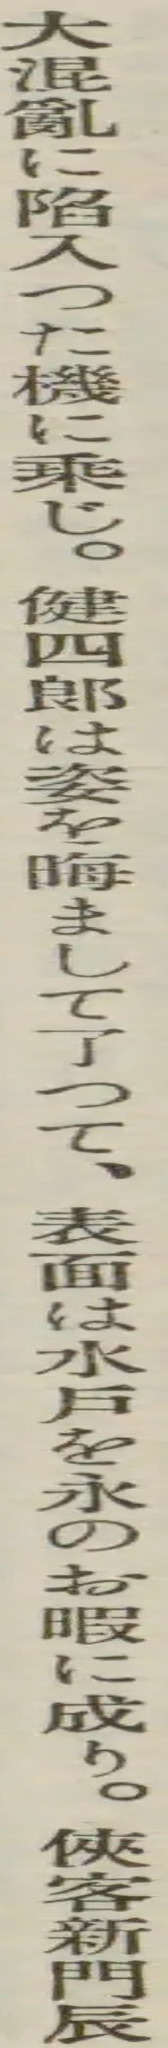大混乱に陥入つた機に乗じ。健四郎は姿を晦まして了つて、表面は水戸を永のお暇に成り。侠客新門辰
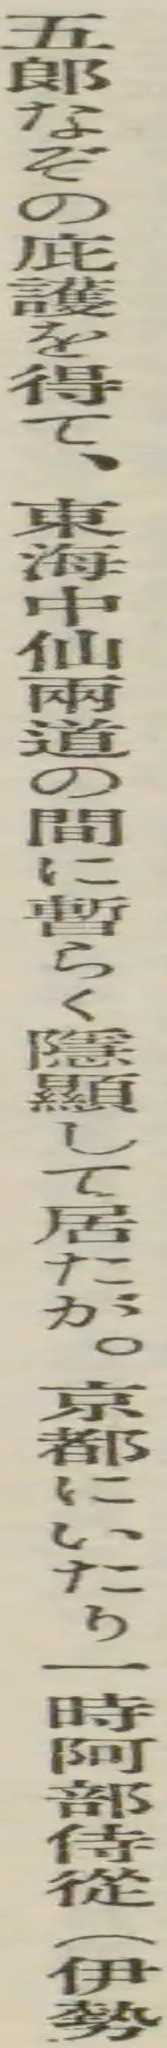五郎なぞの庇護を得て、東海中山両道の間に暫らく隠顕して居たが。京都にいたり一時阿部侍従(伊勢
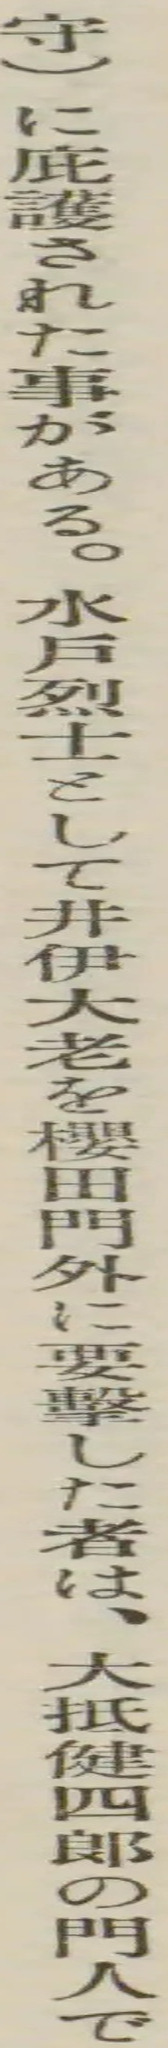守)に庇護された事がある。水戸烈士として井伊大老を桜田門外に要撃した者は、大抵健四郎の門人で
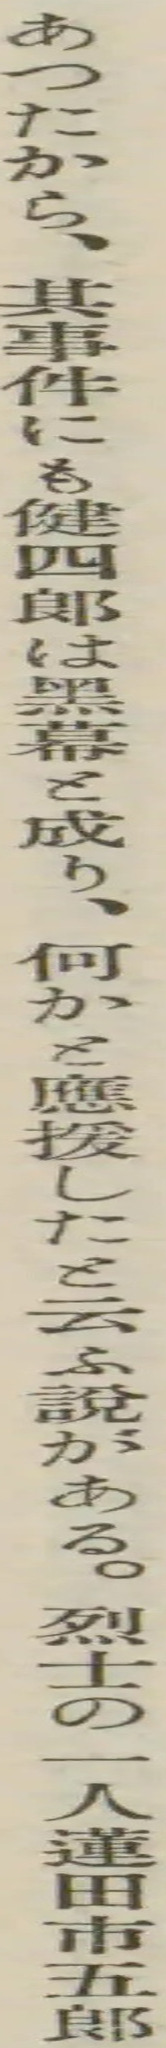あつたから、其事件にも健四郎は黒幕と成り、何かと応援したと云ふ説がある。烈士の一人蓮田市五郎
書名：小野湖山翁小伝
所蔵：国立国会図書館 National Diet Library, JAPAN
